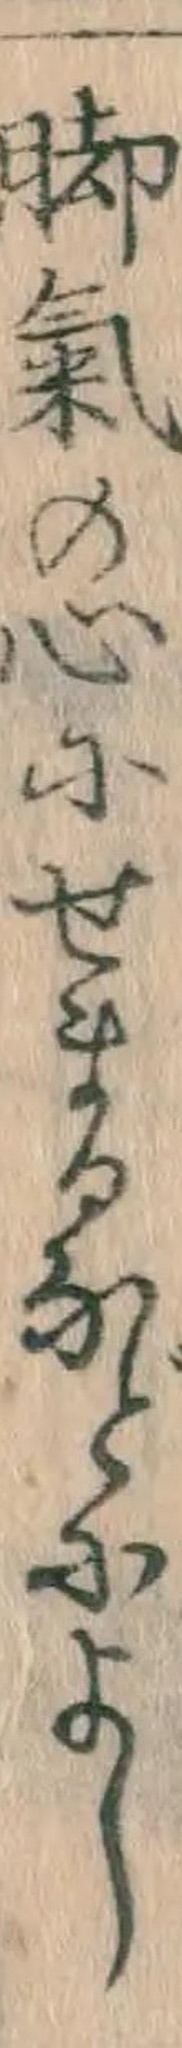脚気の心にせまるなどによし
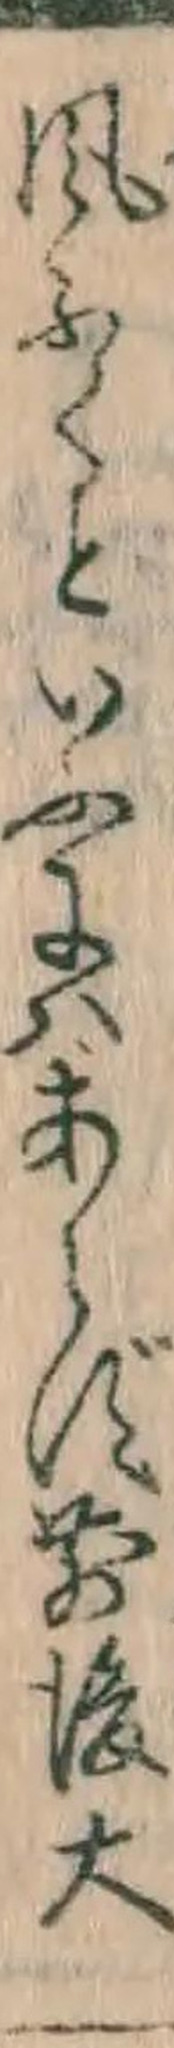風ふくといふにはあらず前後大
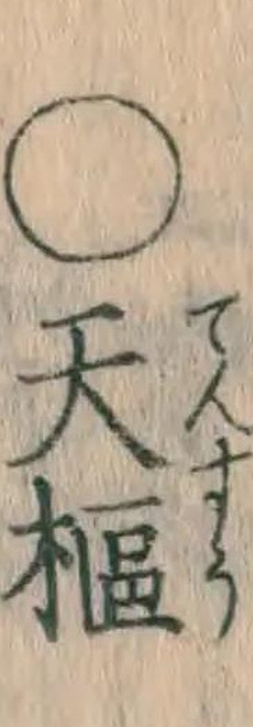○天枢
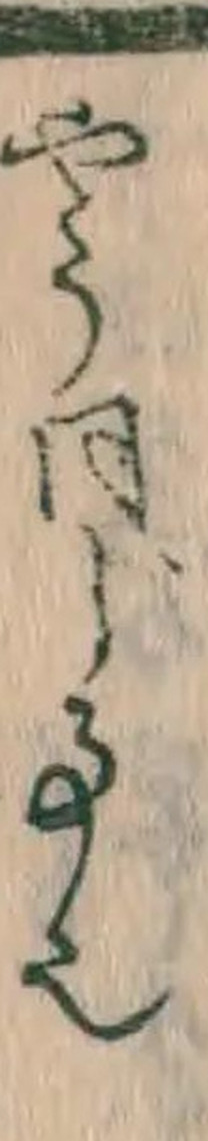やう同じ事也
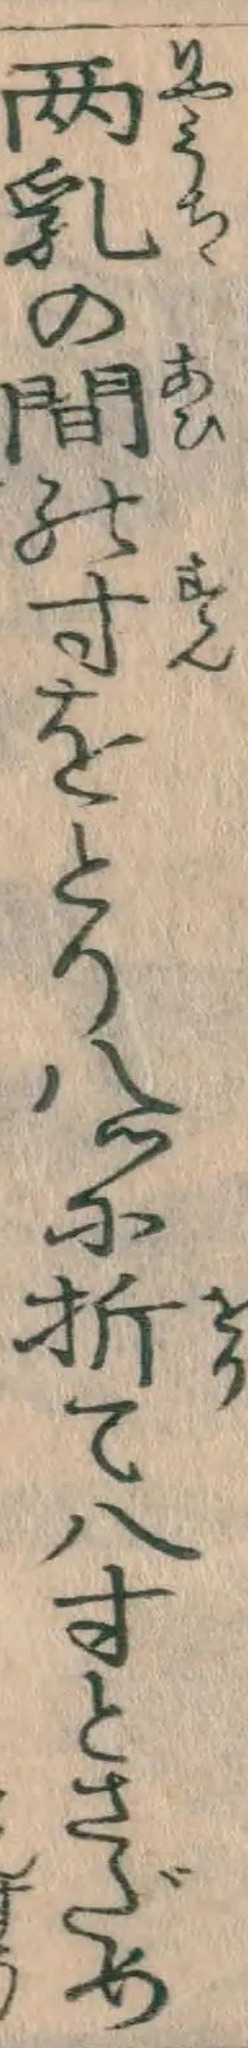両乳の間の寸をとり八ッに折て八寸とさだめ
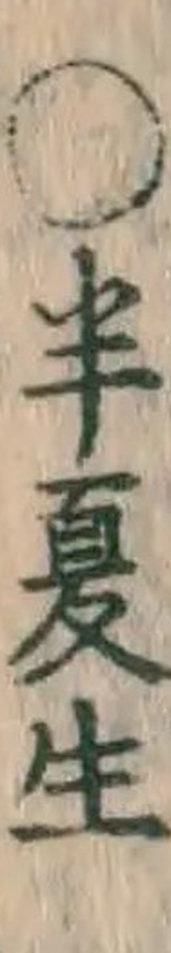○半夏生
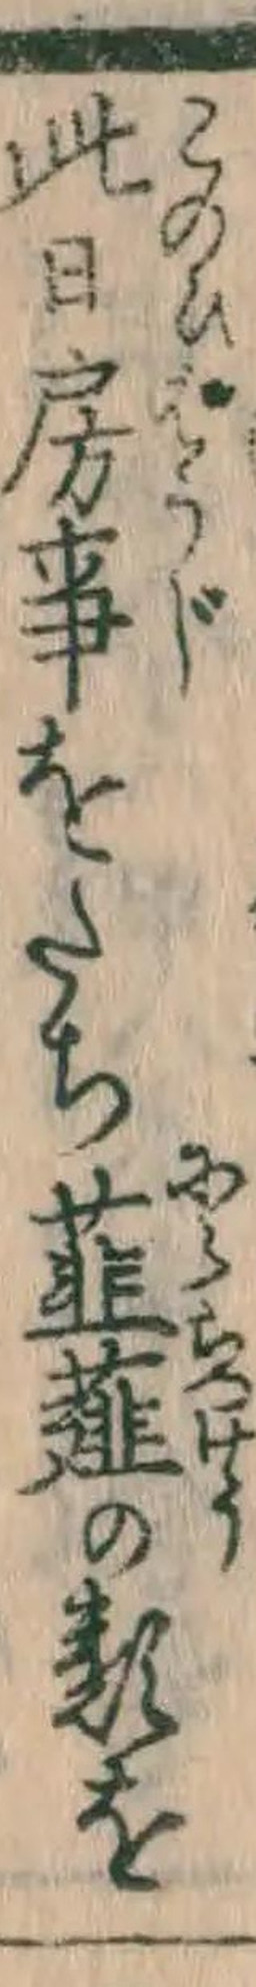此日房事をたち韮薤の類を
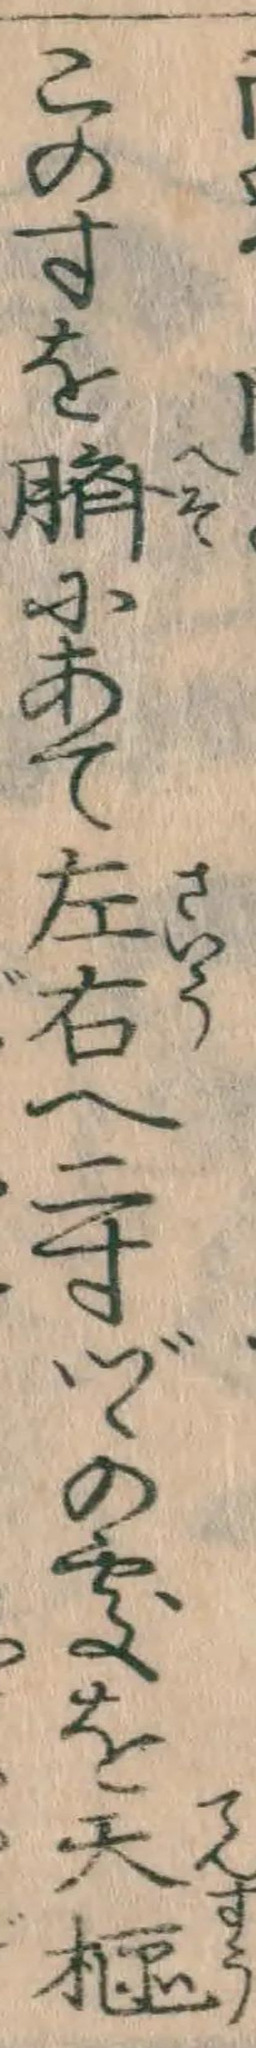この寸を臍にあて左右へ二寸づゝの処を天枢
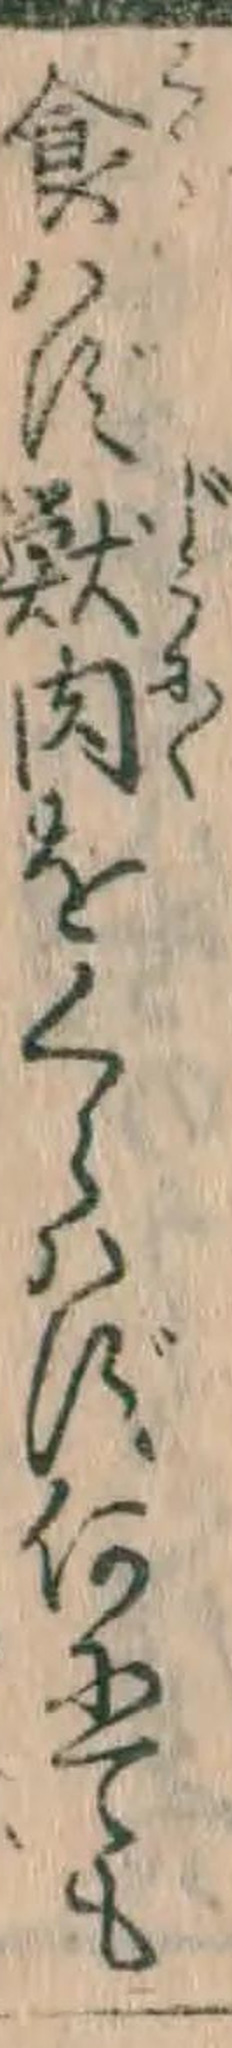食はず獣肉をくらはず何にても
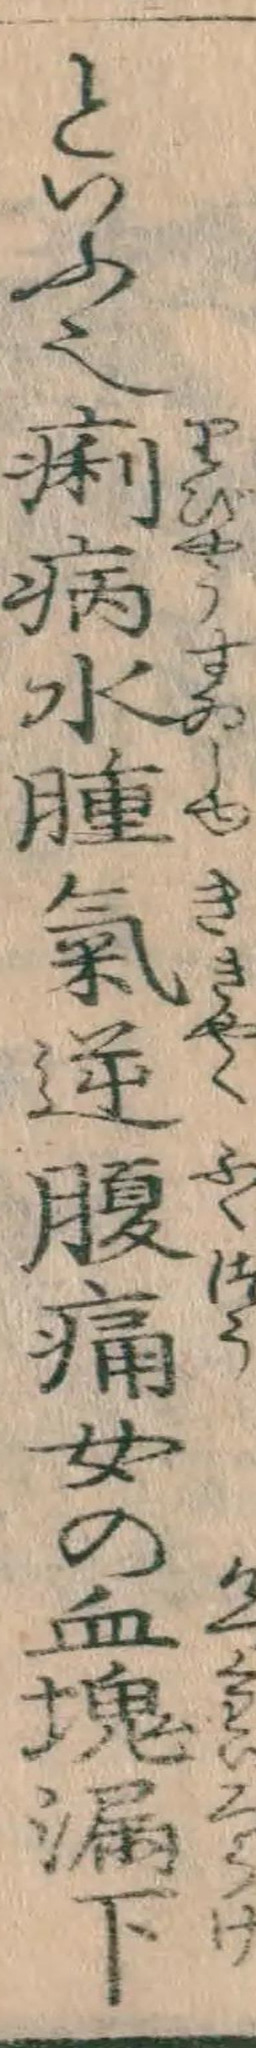といふ也痢病水腫気逆腹痛女の血塊漏下
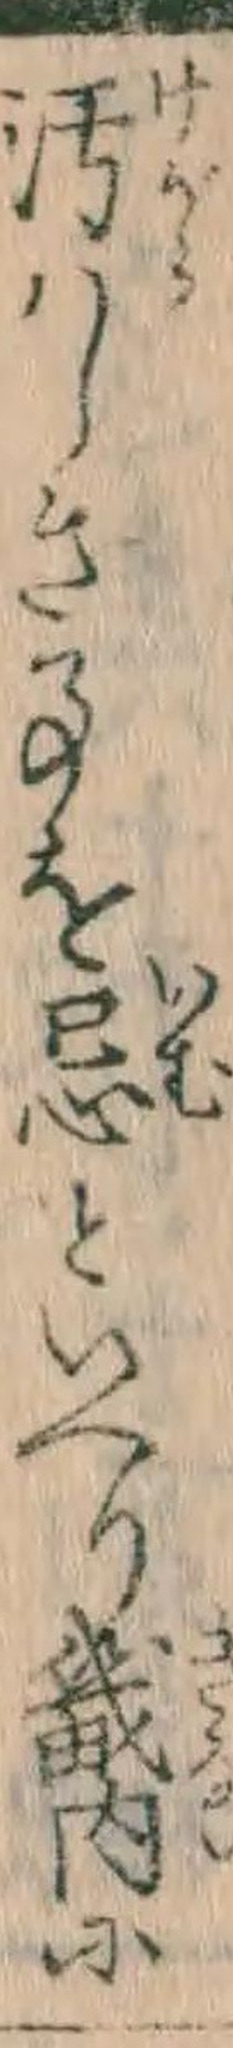汚はしき事を忌といへり畿内に
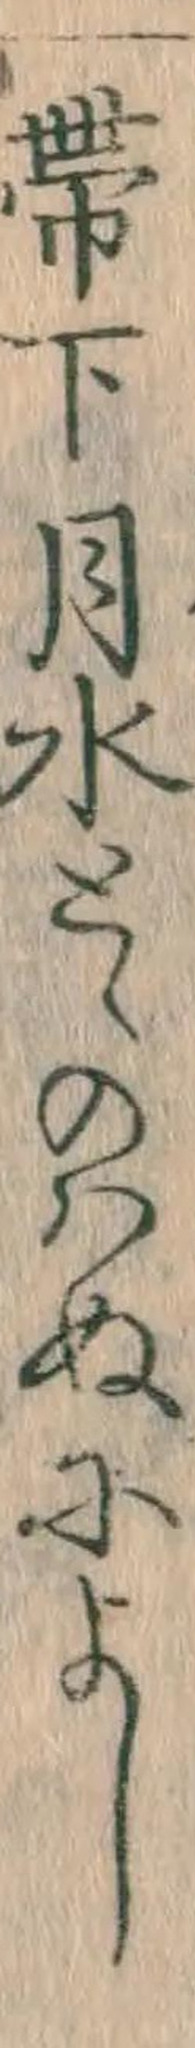帯下月水とゝのはぬによし
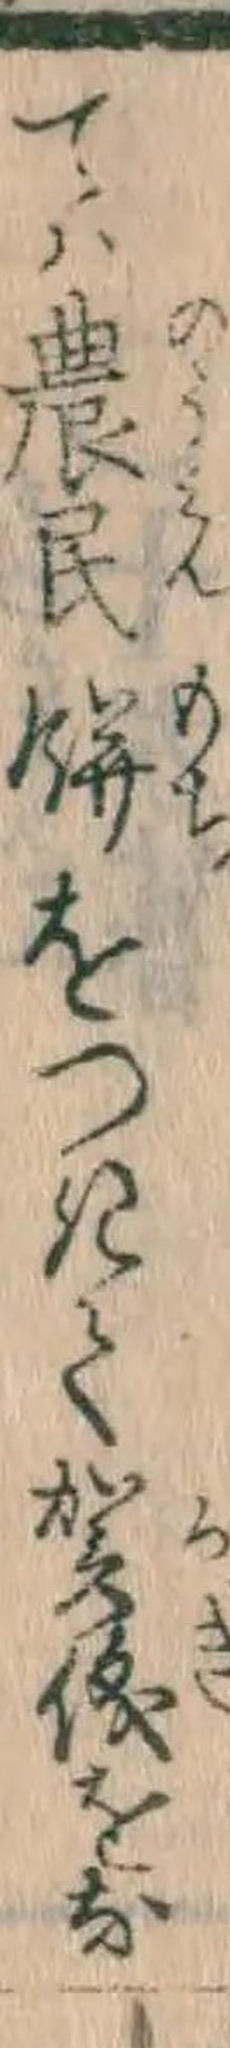ては農民餅をつきて賀儀をな
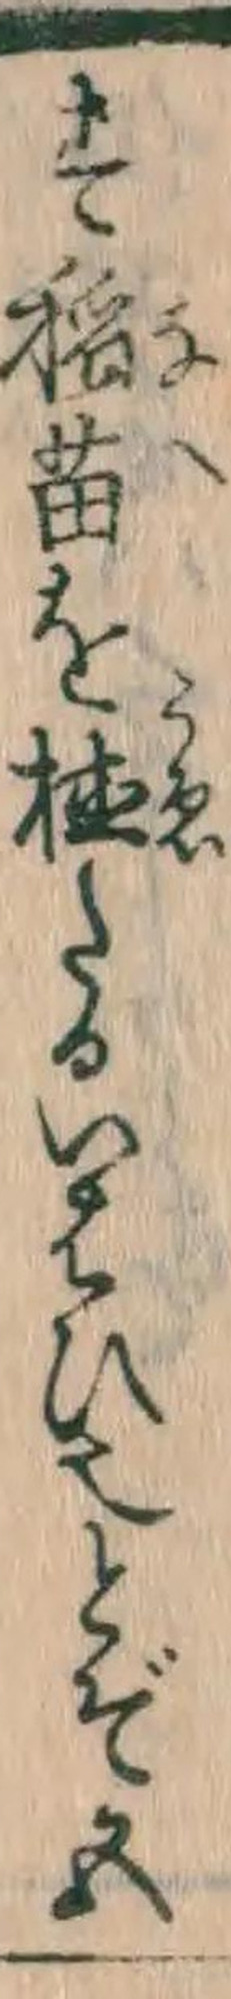す稲苗を植たるいはひ也とぞ五
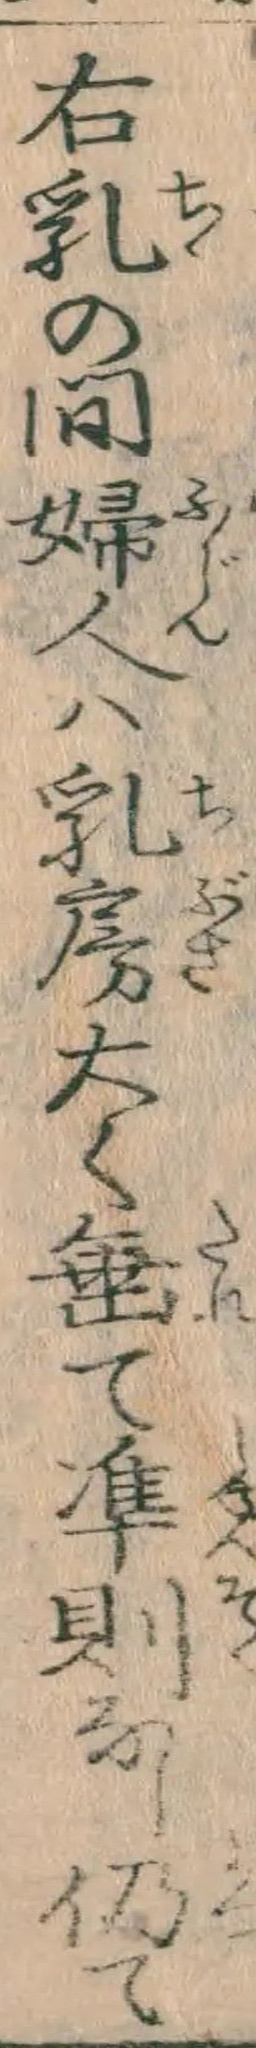右乳の間婦人は乳房大く垂て準則なし仍て
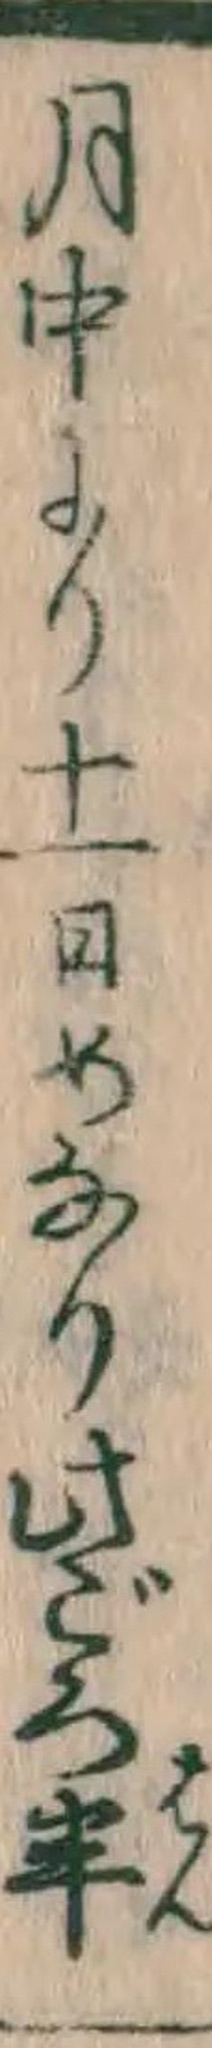月中より十一日めなり此ごろ半
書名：広益秘事大全 3巻. [4]
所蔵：国立国会図書館 National Diet Library, JAPAN
